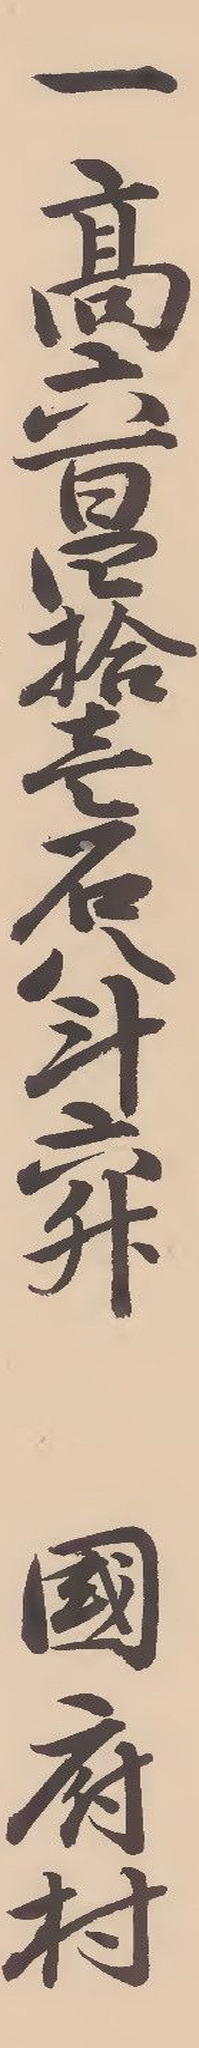一高六百四拾壱石八斗六升国府村
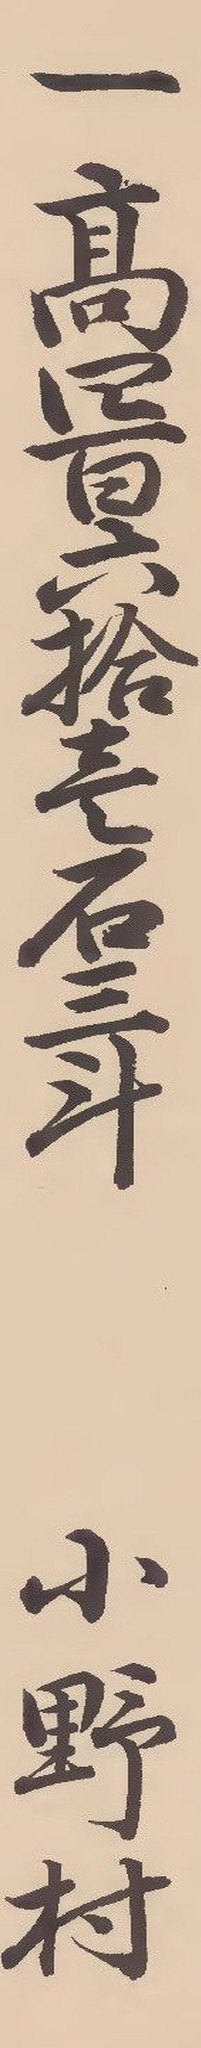一高四百六拾壱石三斗小野村
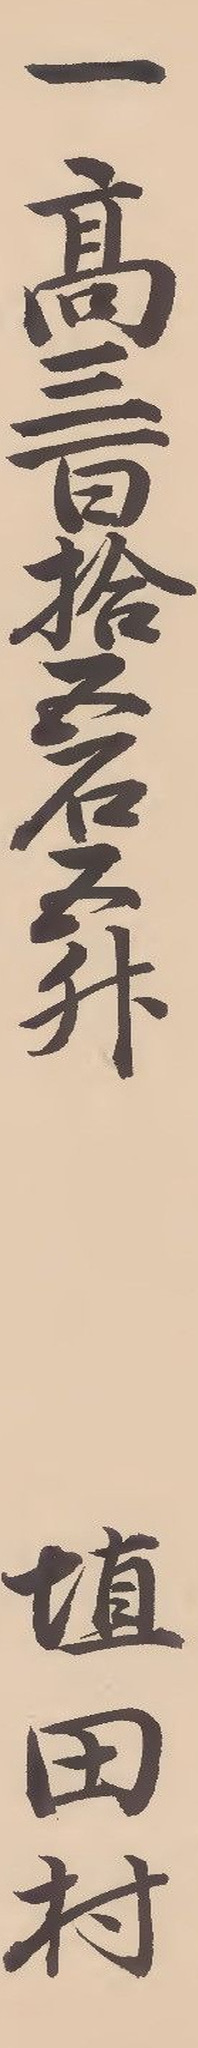一高三百拾五石五升埴田村
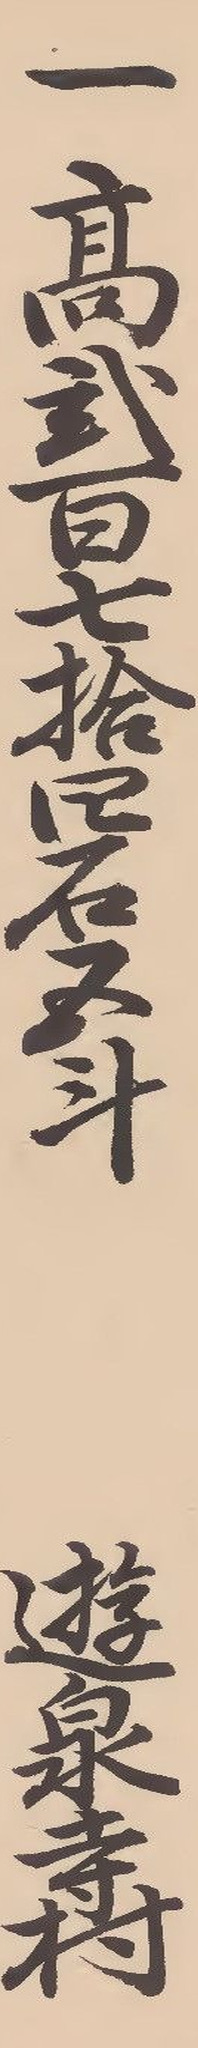一高弐百七拾四石五斗遊泉寺村
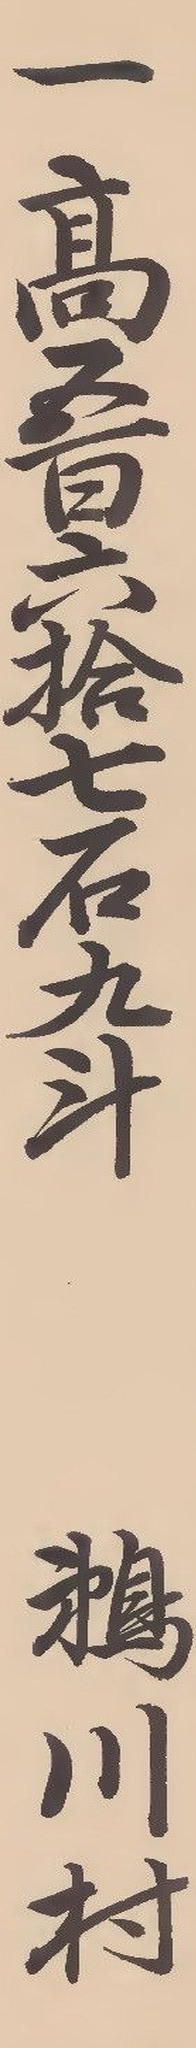一高五百六拾七石九斗鵜川村
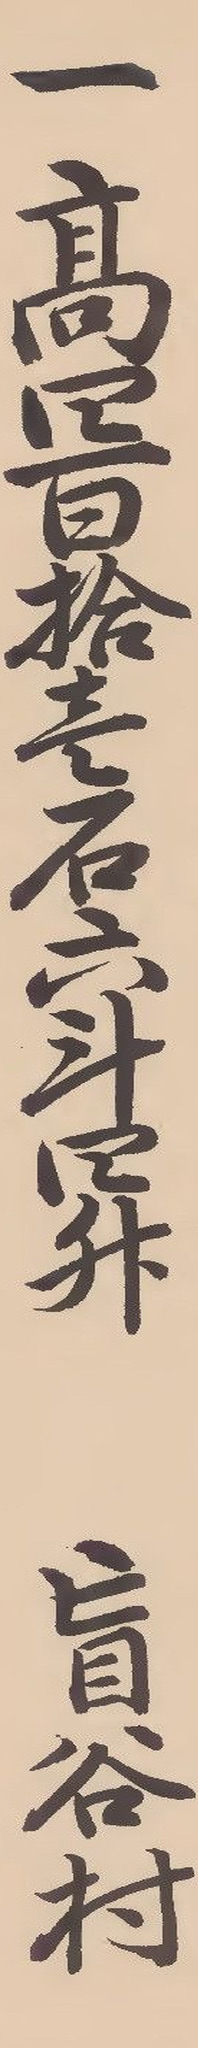一高四百拾壱石六斗四升盲谷村
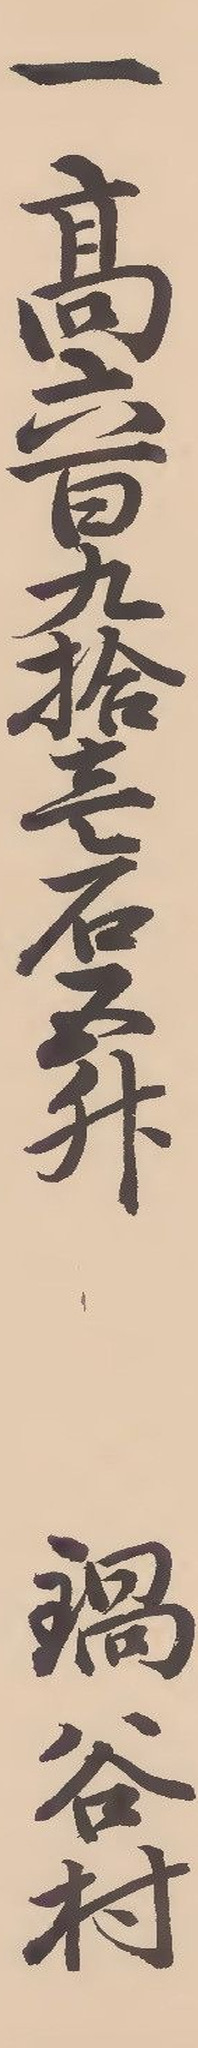一高六百九拾壱石五升鍋谷村

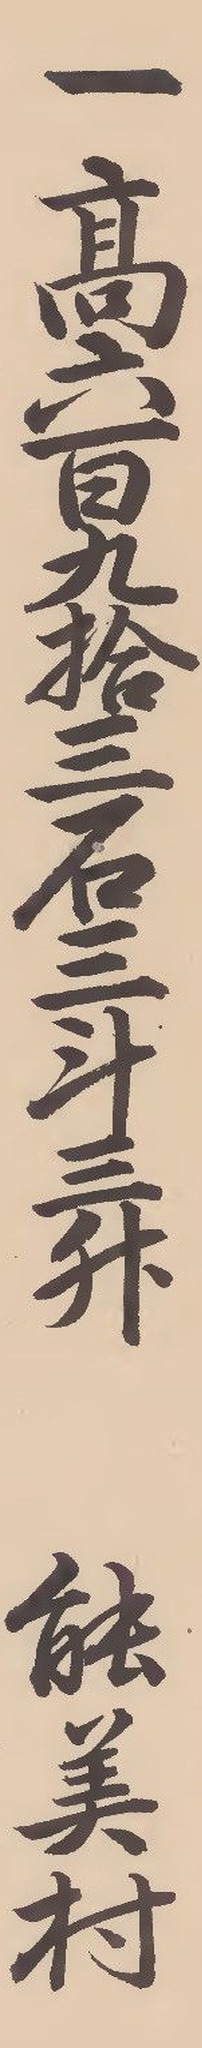一高六百九拾三石三斗三升能美村
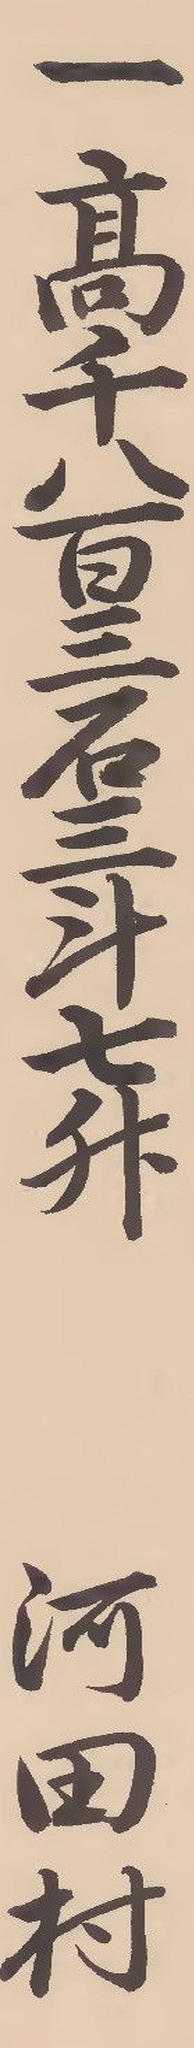一高千八百三石三斗七升河田村
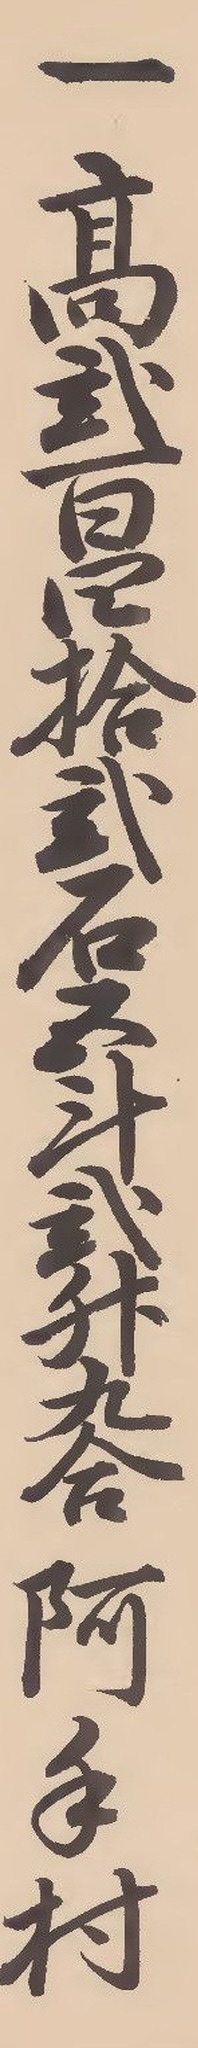一高弐百四拾弐石五斗弐升九合阿手村
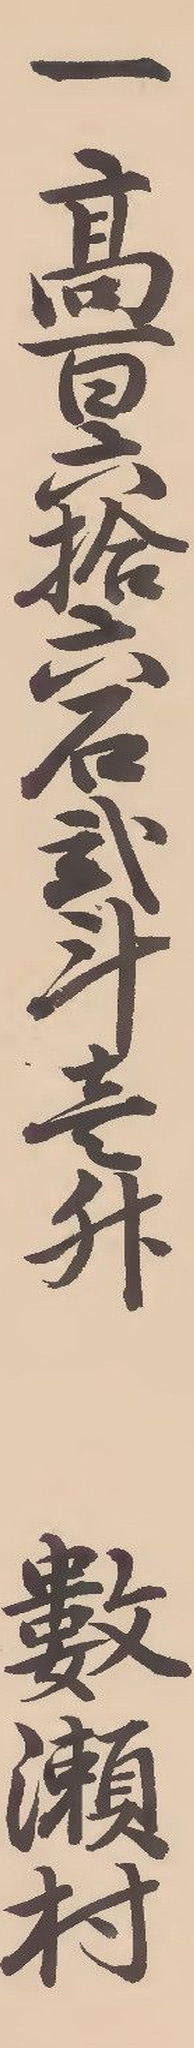一高百六拾六石弐斗壱升数瀬村
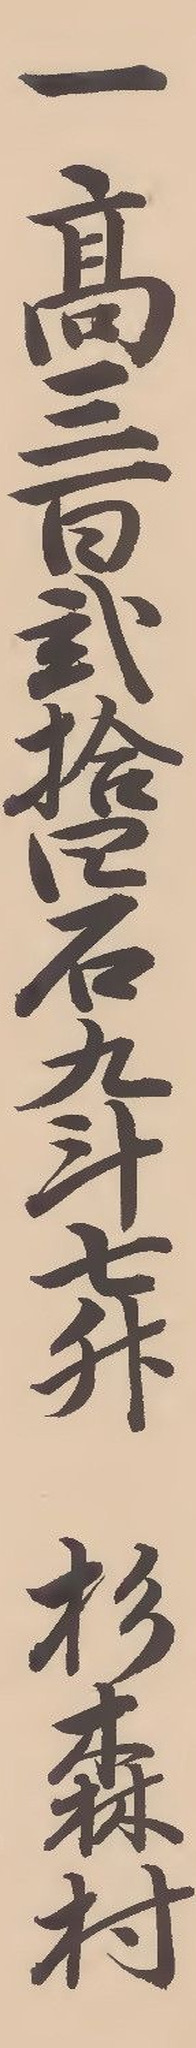一高三百弐拾四石九斗七升杉森村
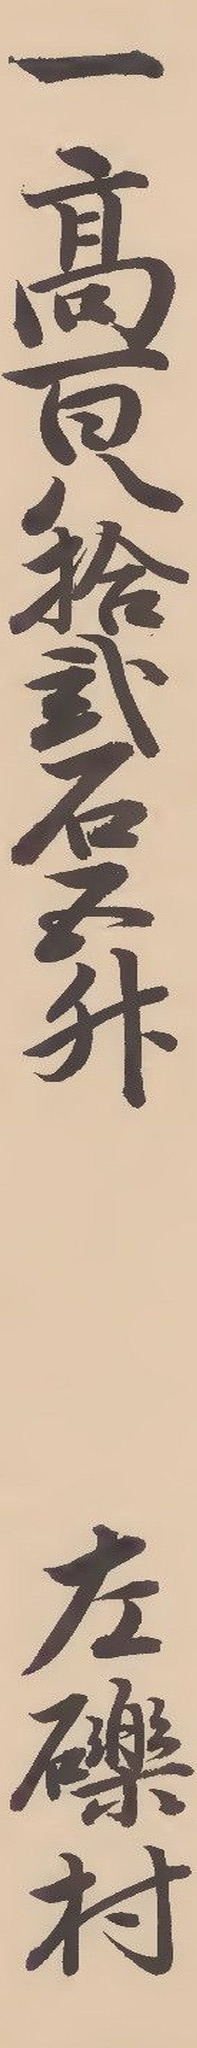一高百八拾弐石五升左礫村

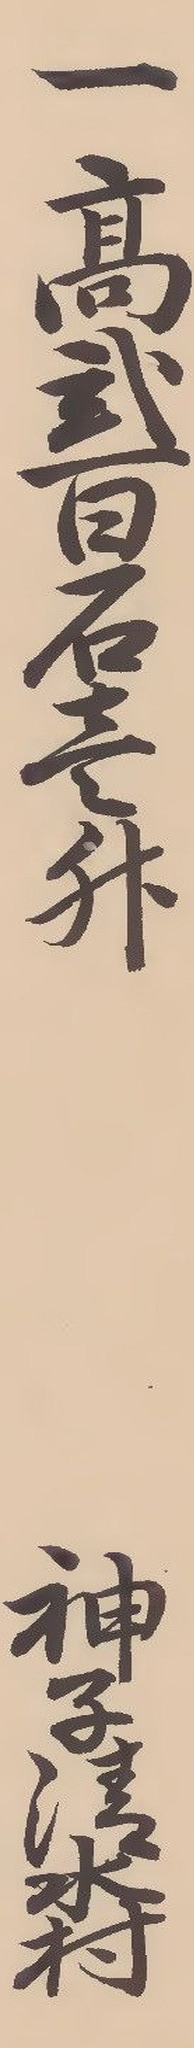一高弐百石壱升神子清水村
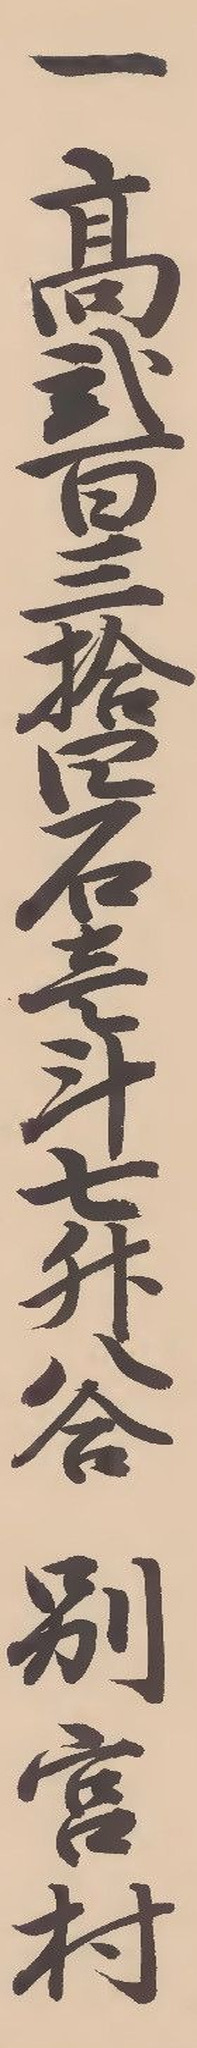一高弐百三拾四石壱斗七升八合別宮村
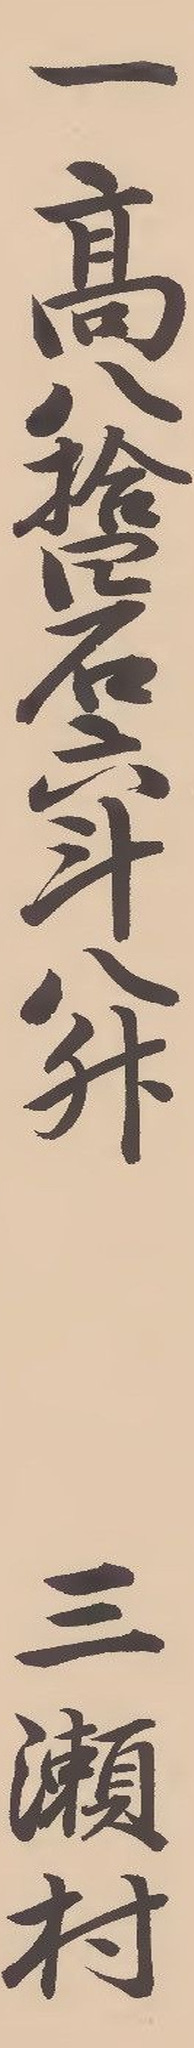一高八拾四石六斗八升三瀬村
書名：加賀国郷帳
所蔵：国立公文書館 National Archives of Japan
